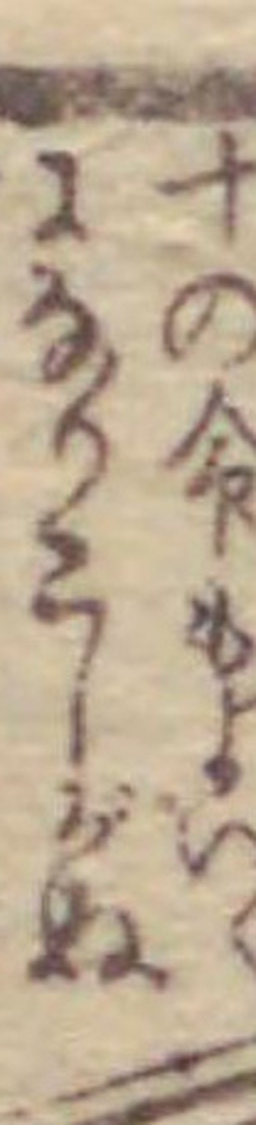になりこしがぬ
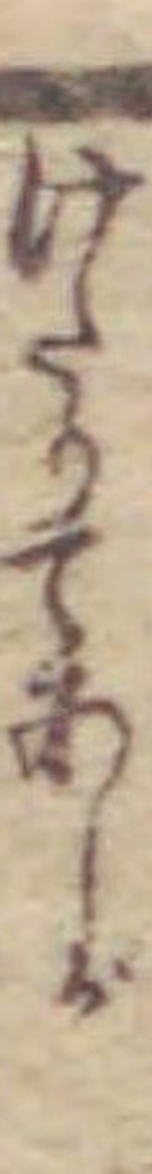けたりてあしが
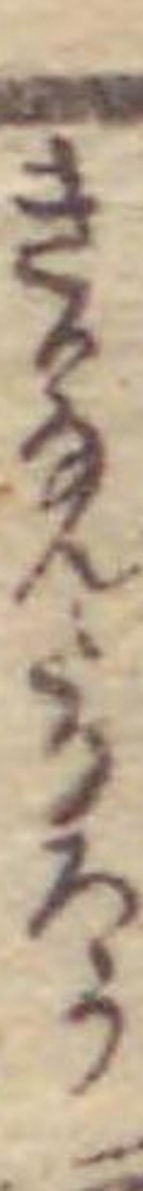きかなんたりろう
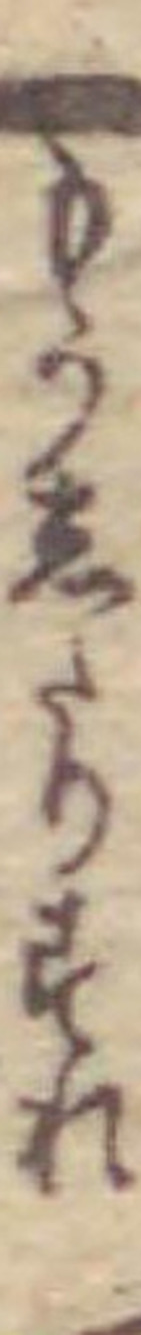もうしたりすれ
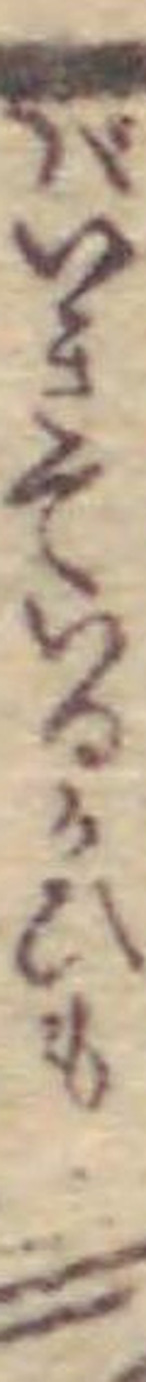ばいきているかひも
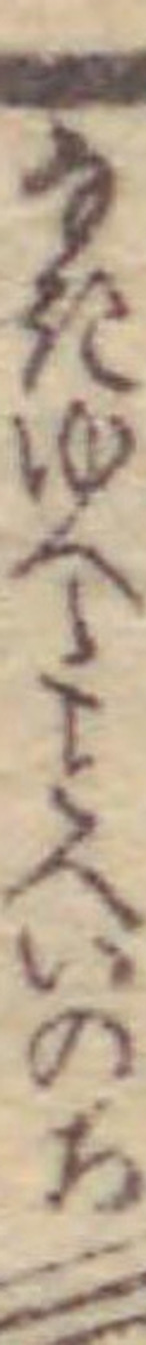なきゆへたとへいのち
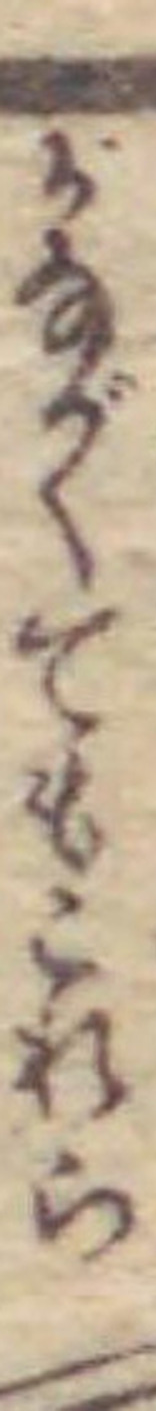がながくてもこれら
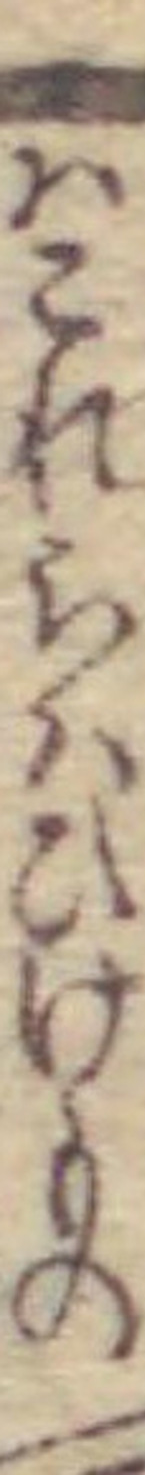はこれらはひけもの
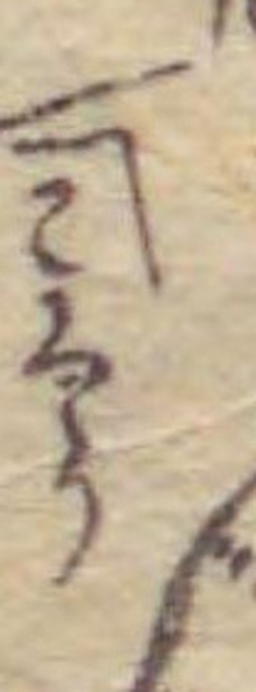〽こくう
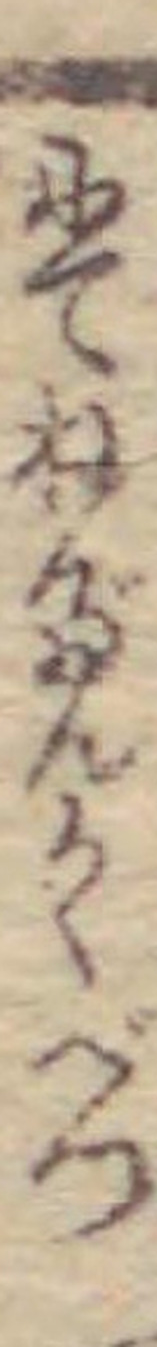にてねだんかくべつ
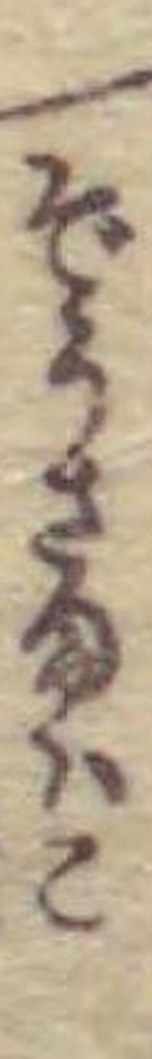ぞうさまはこ
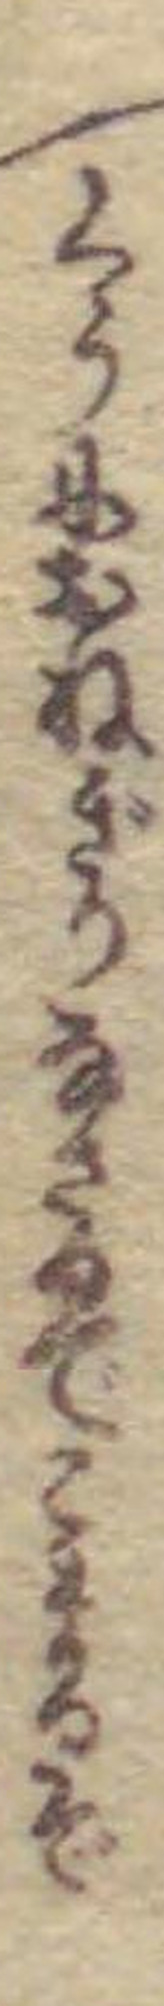くうにおねぎりなさるでこまるぞ

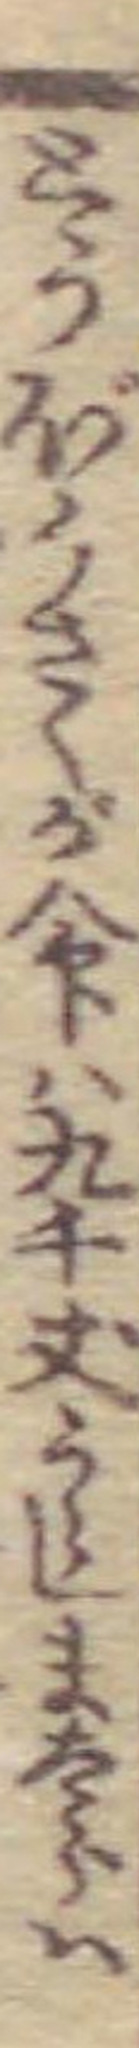とうぼうさくが命は九千丈うらしま太郎は
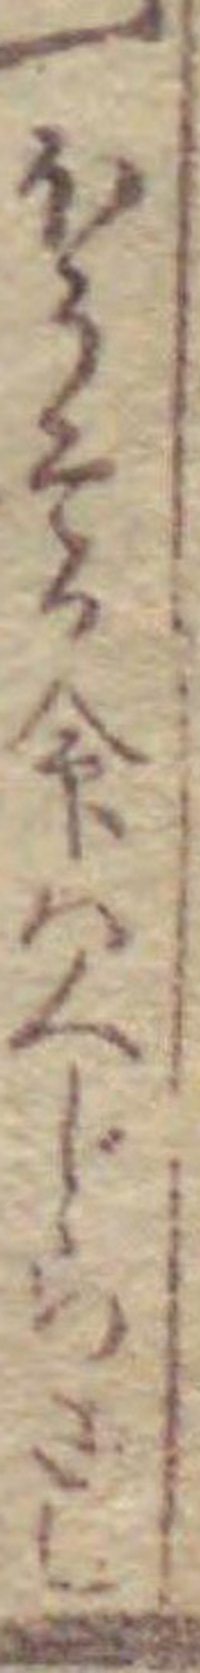ほうそか命はくじらざし
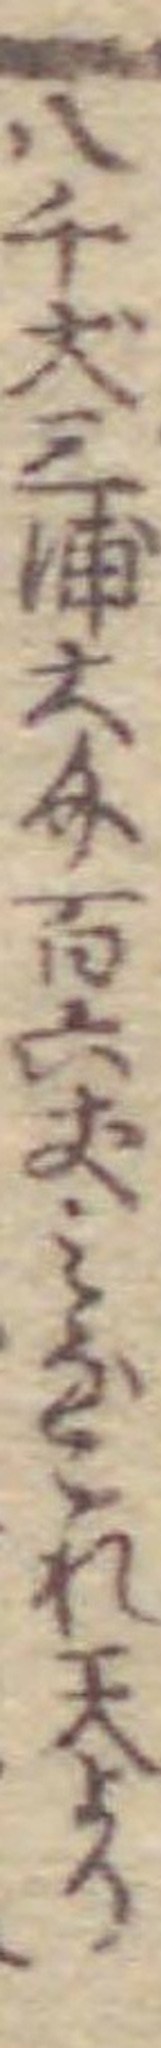八千丈三浦大介百六丈みなこれ天より
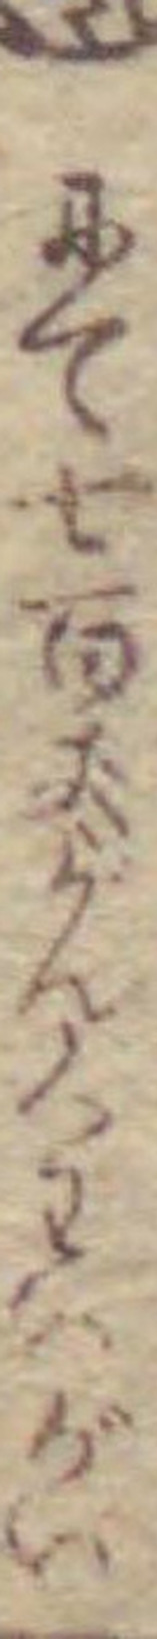にて七百丈ばんくわいがい
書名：御誂染長寿小紋 : 3巻
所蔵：国立国会図書館 National Diet Library, JAPAN
